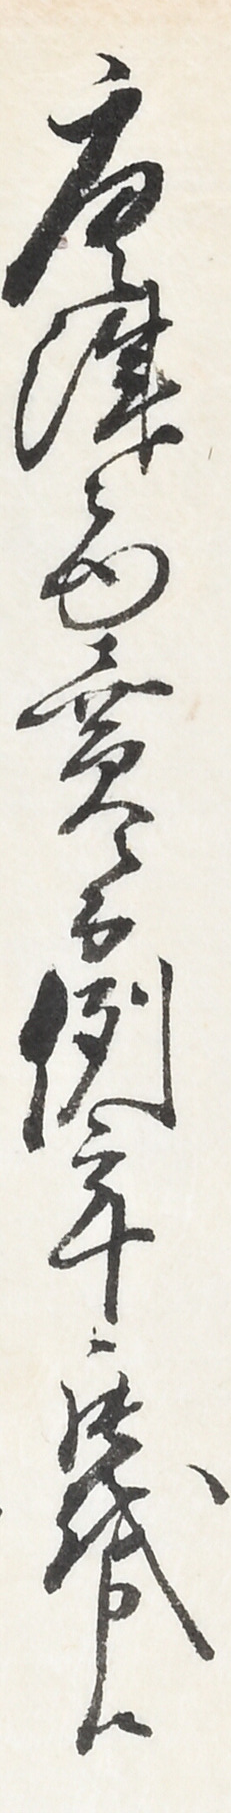唐津商売ニ而例年罷越申候
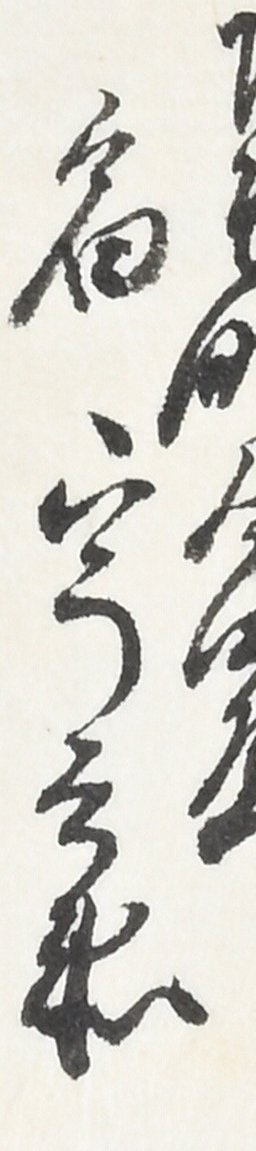宿宇兵衛
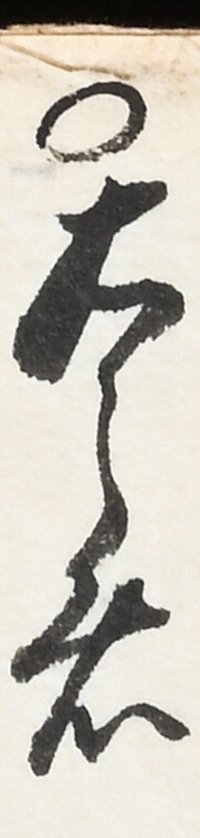〇右之者
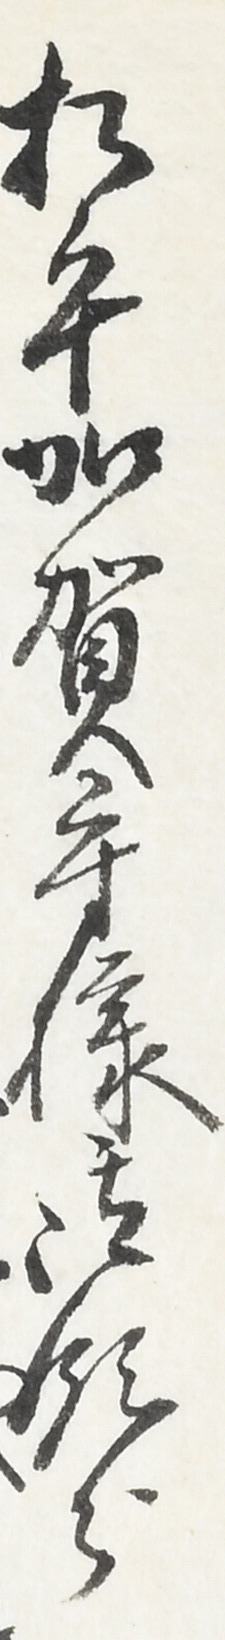松平加賀守様御領分
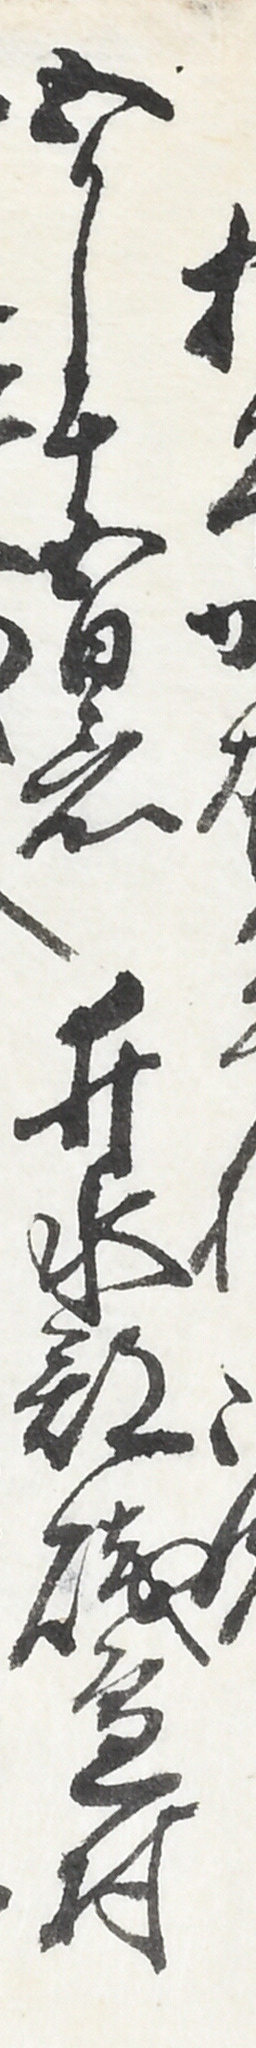五月十五日着井水郡磯辺村
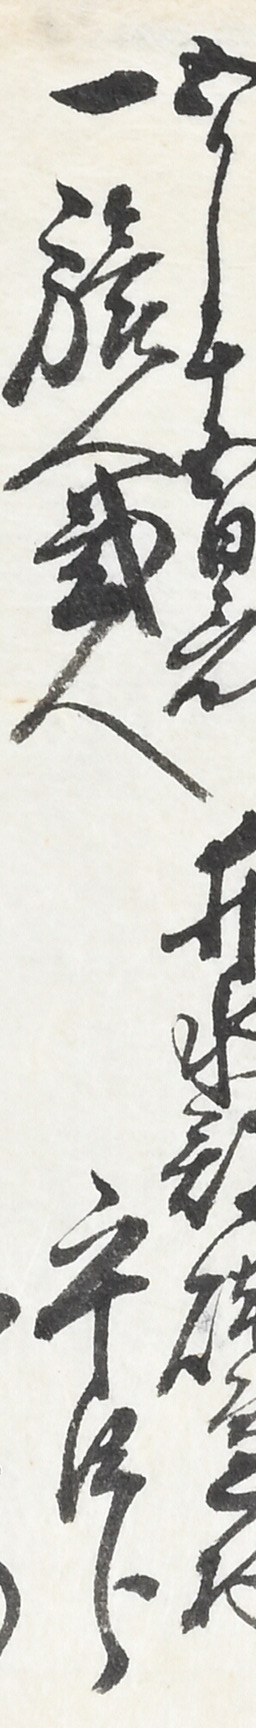一旅人弐人平四郎
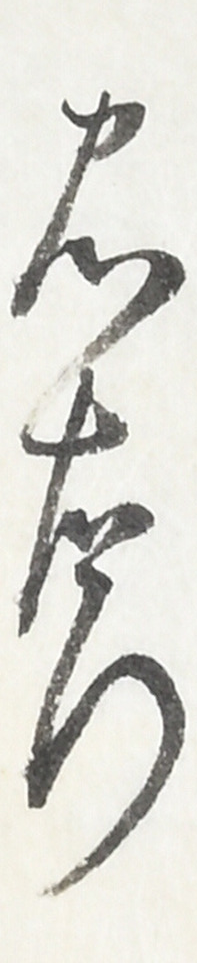忠右衛門
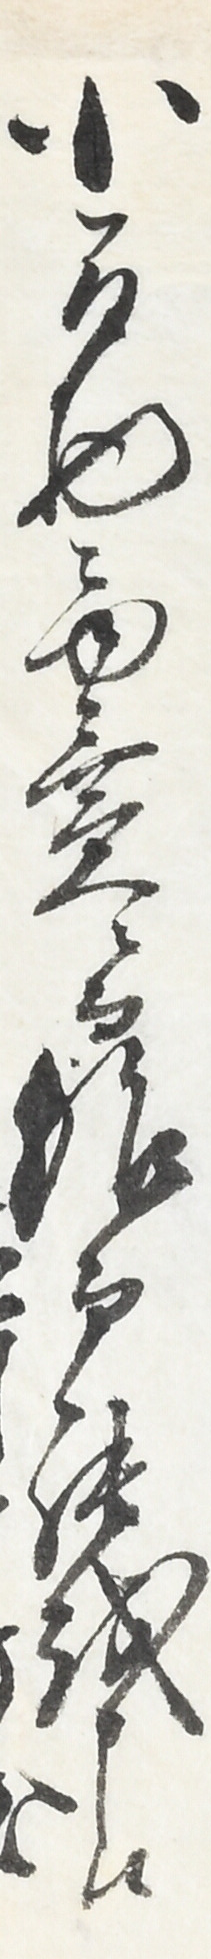小間物商売ニ而始而罷越申候
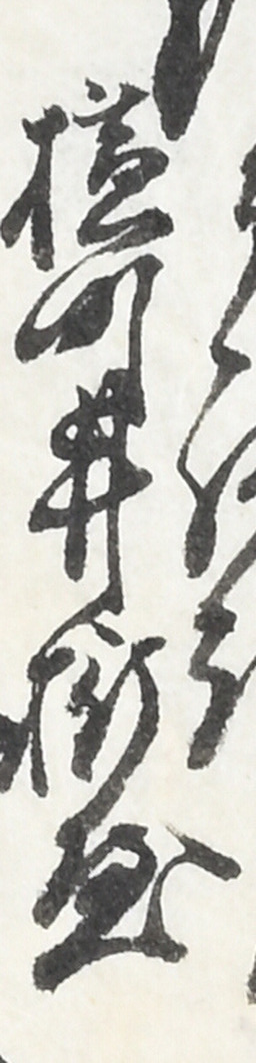横町井桁屋
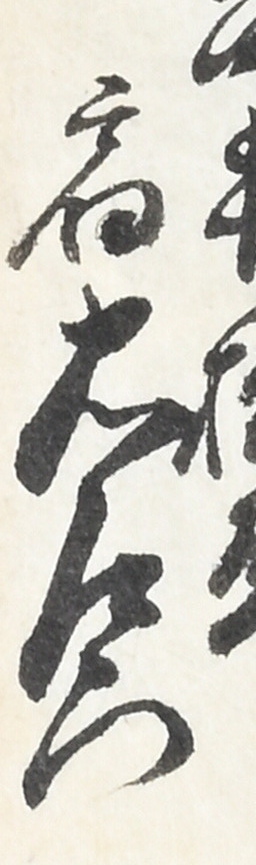宿忠右衛門

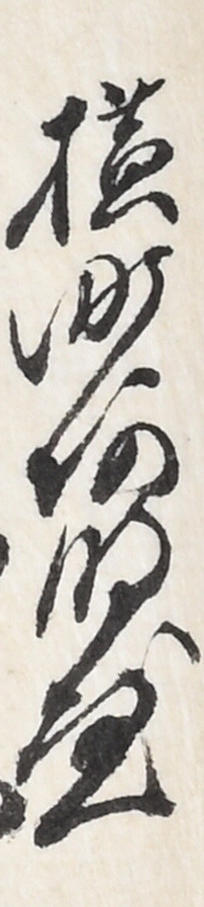横町阿明屋
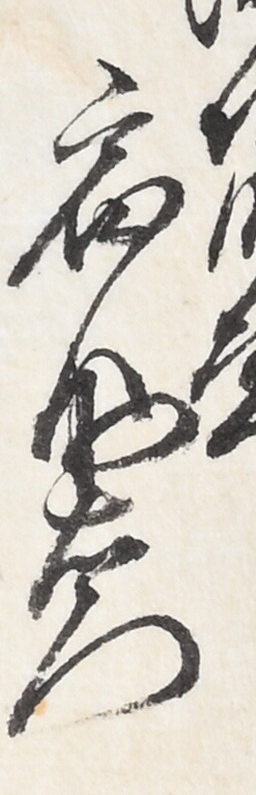宿助右衛門
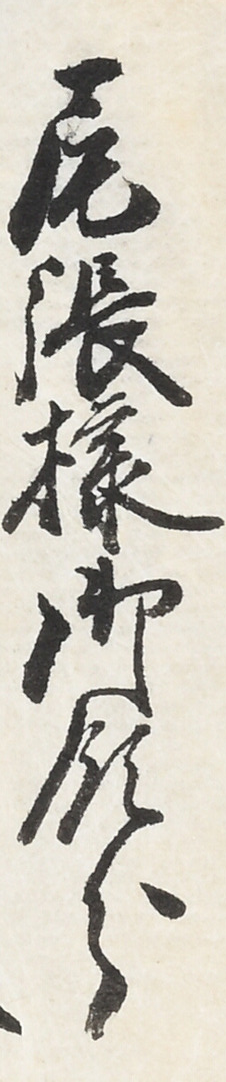尾張様御領分
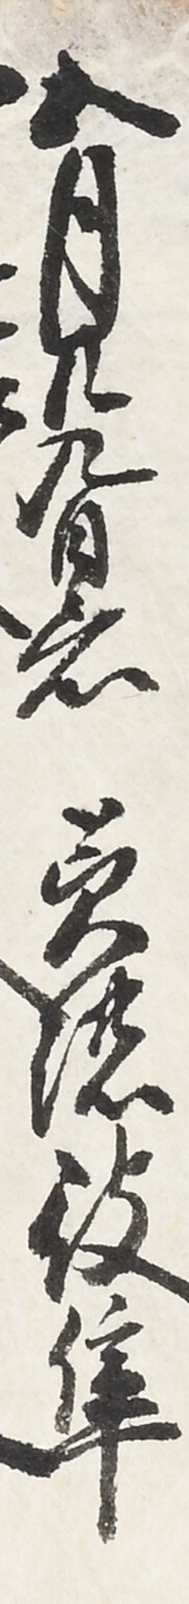五月廿九日着美濃役隼
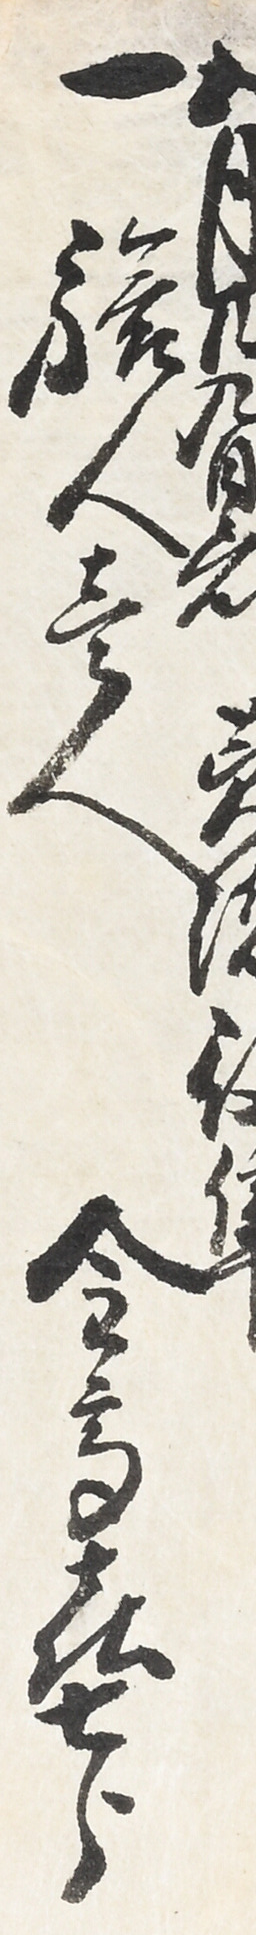一旅人壱人金高喜七郎
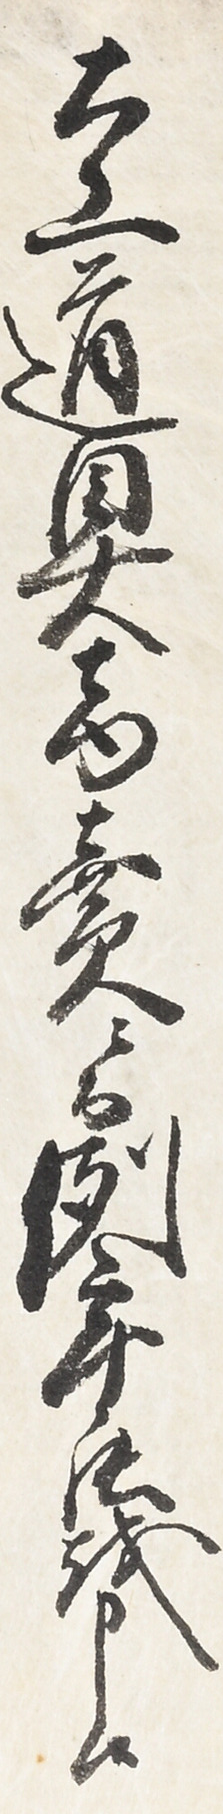大工道具商売ニ而例年罷越申候
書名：旅人泊控帳
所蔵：伊那市立高遠町図書館・合同会社AMANE
